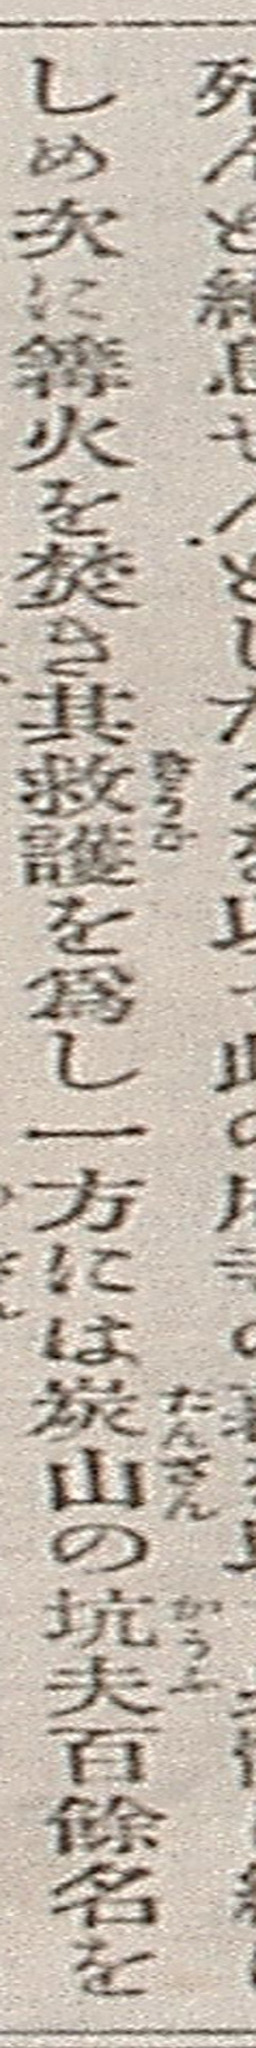しめ次に篝火を焚き其救護を為し一方には炭山の坑夫百余名を
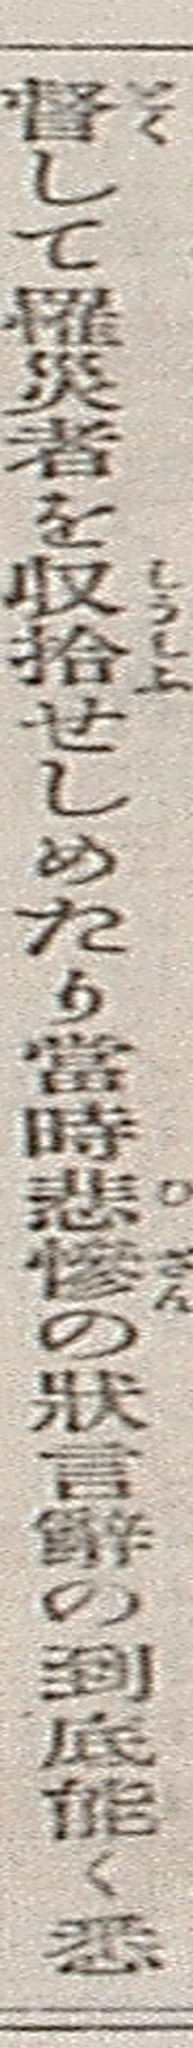督して罹災者を収拾せしめたり当時悲惨の状言辞の到底能く悉
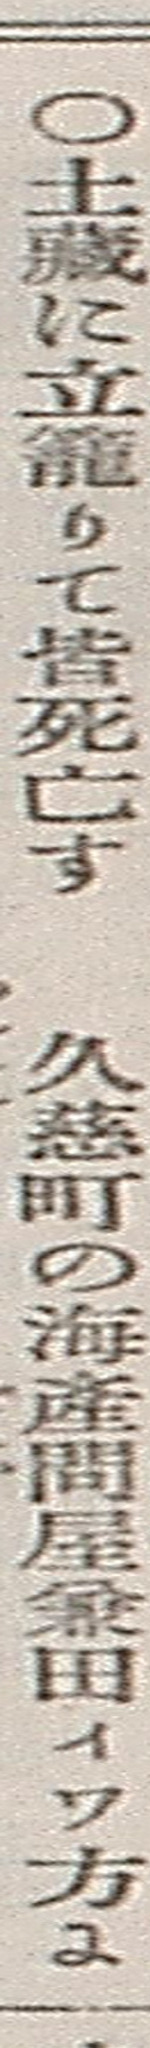〇土蔵に立籠りて皆死亡す久慈町の海産問屋兼田イワ方に
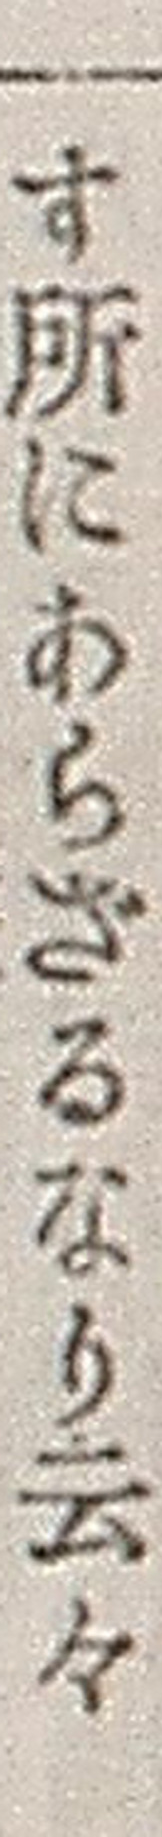す所にあらざるなり云々
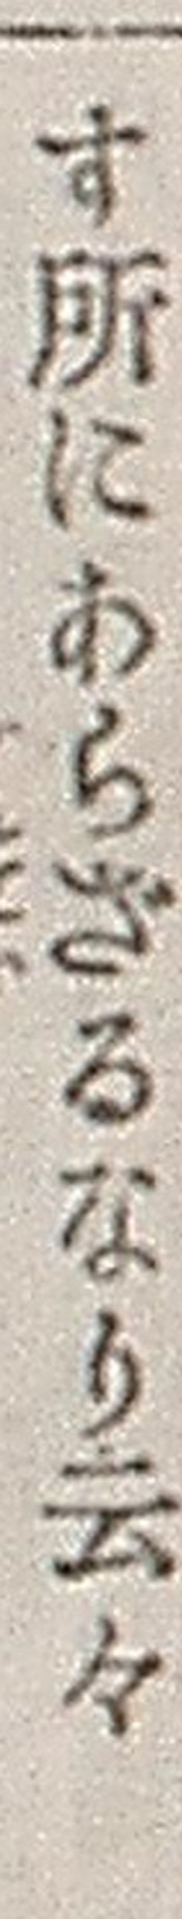す所にあらざるなり云々
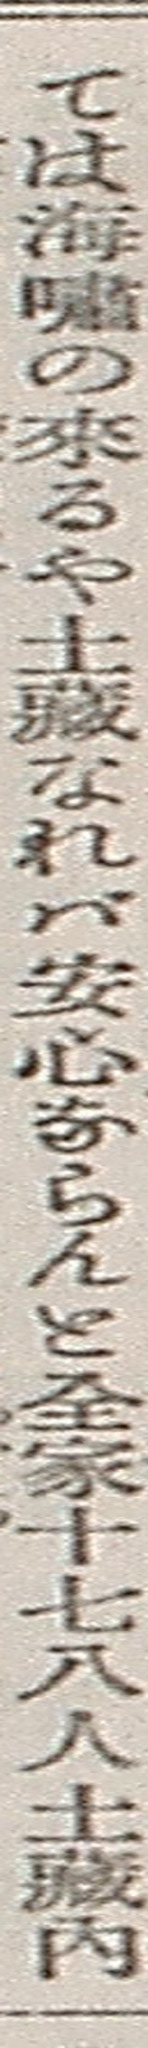ては海嘯の来るや土蔵なれば安心ならんと全家十七八人土蔵内
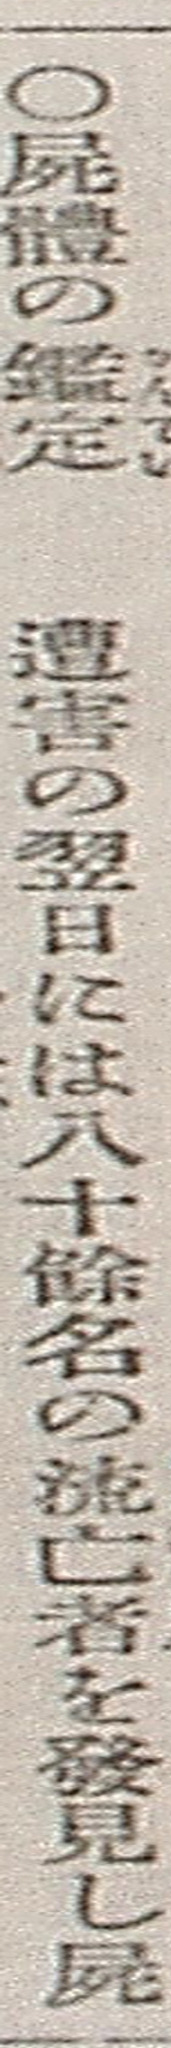〇死屍の鑑定遭害の翌日には八十余名の流亡者を発見し屍
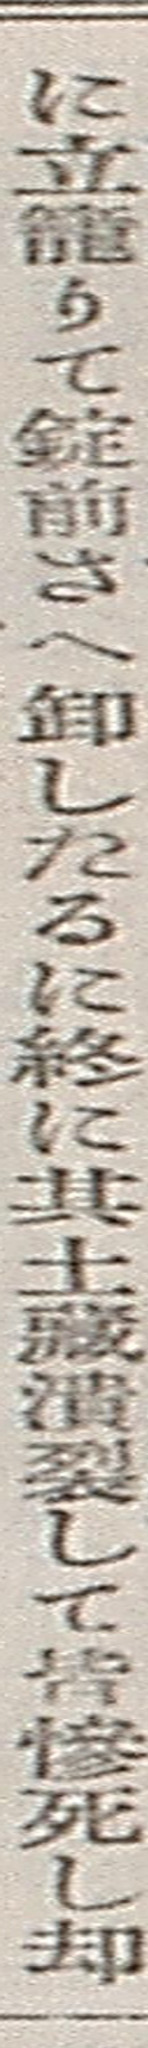に立籠りて錠前さへ卸したるに終に其土蔵潰裂して皆惨死し却
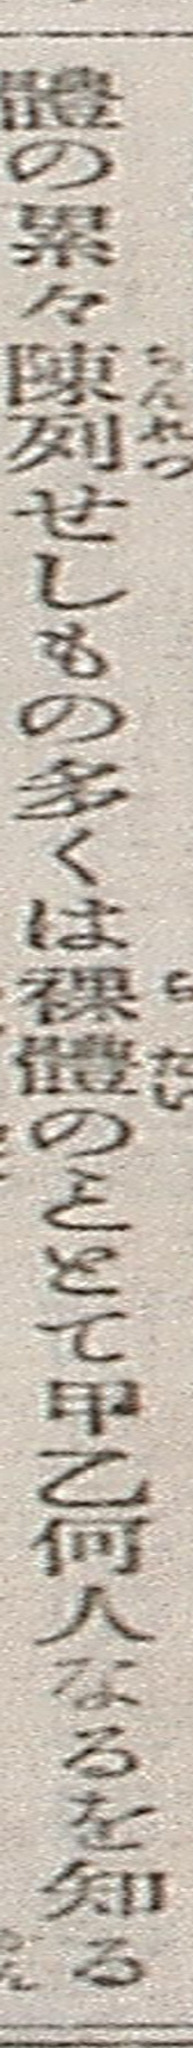体の累々陳列せしもの多くは裸体のこととて甲乙何人なるを知る
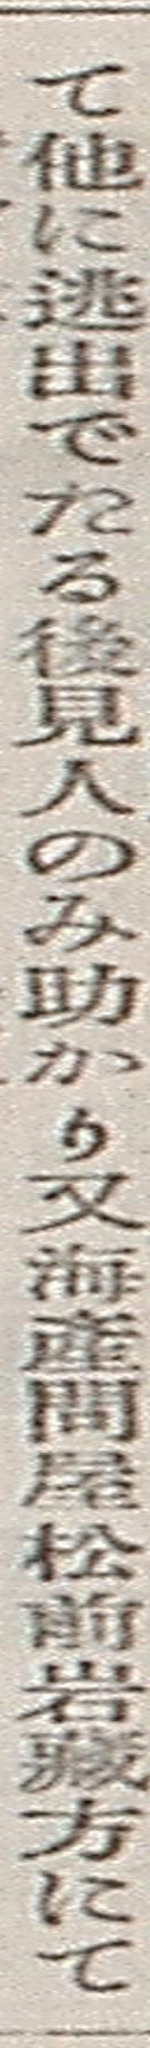て他に逃出でたる後見人のみ助かり又海産問屋松前岩蔵方にて
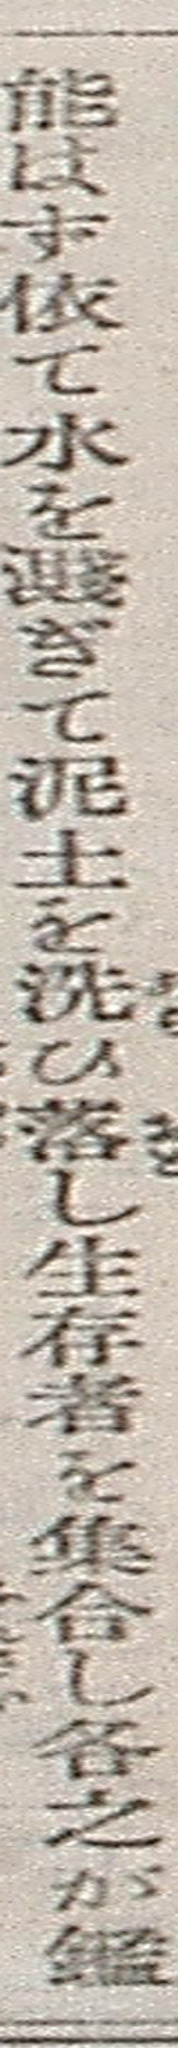能はず依て水を濺ぎて泥土を洗ひ落し生存者を集合し各之が鑑
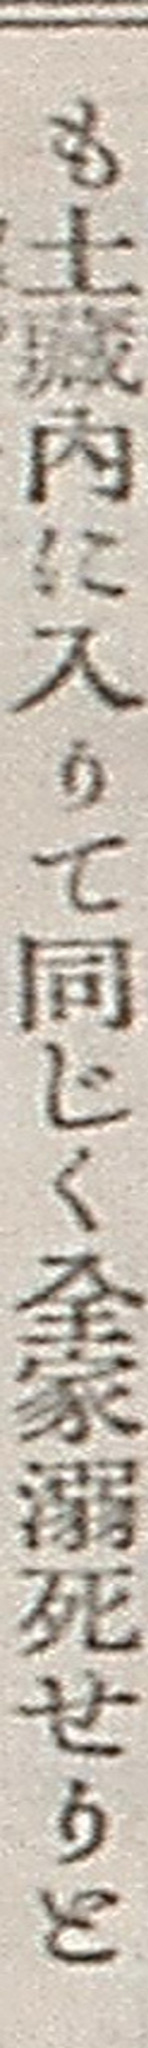も土蔵内に入りて同じく全家溺死せりと
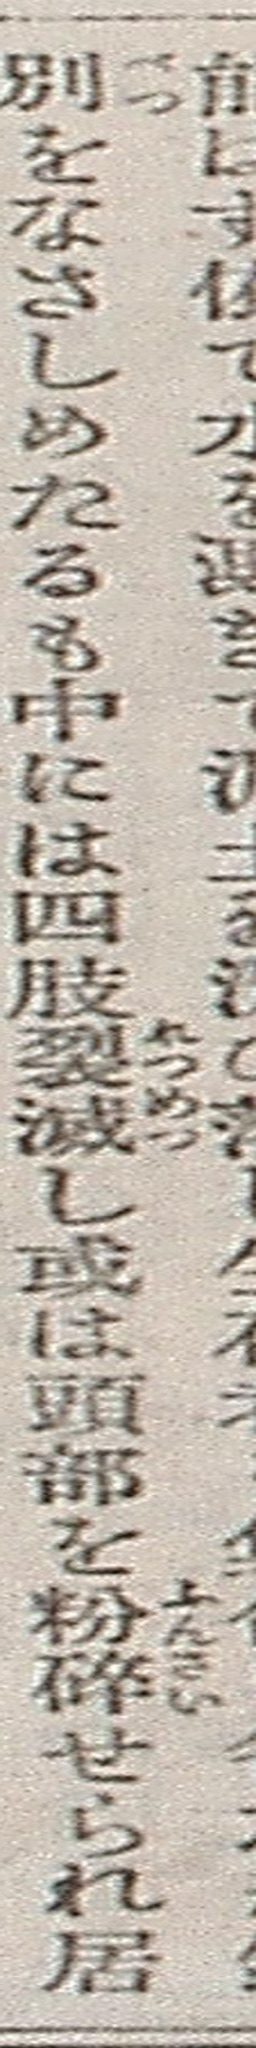別をなさしめたるも中には四肢裂滅し或は頭部を粉砕せられ居
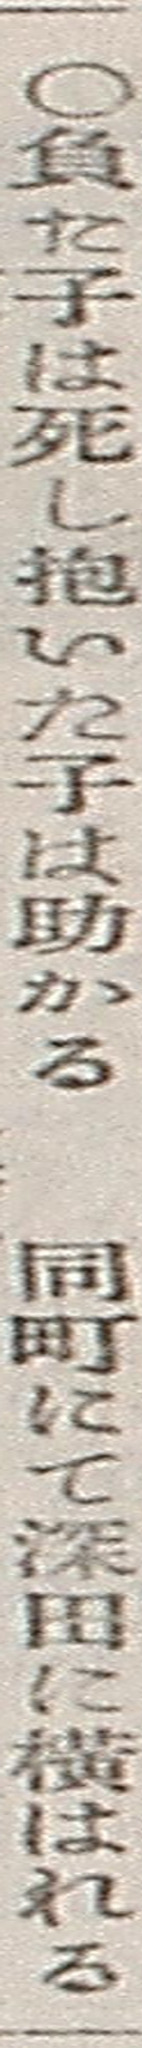〇負た子は死し抱いた子は助かる同町にて深田に横はれる
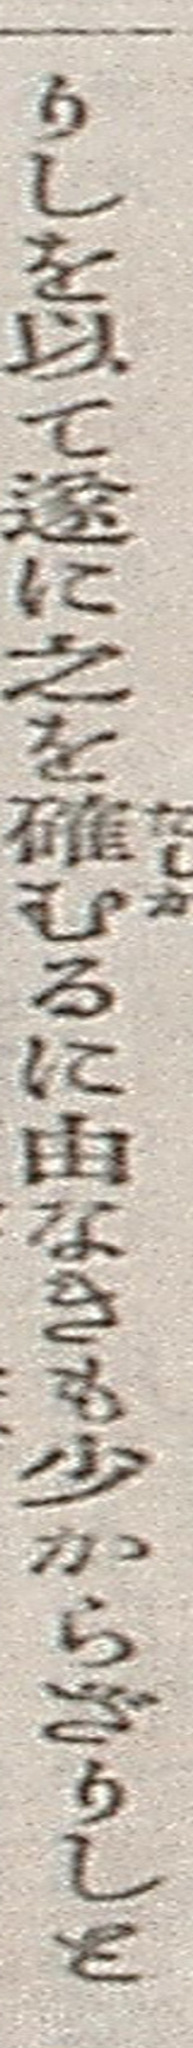りしを以て遂に之を確むるに由なきも少からざりしと
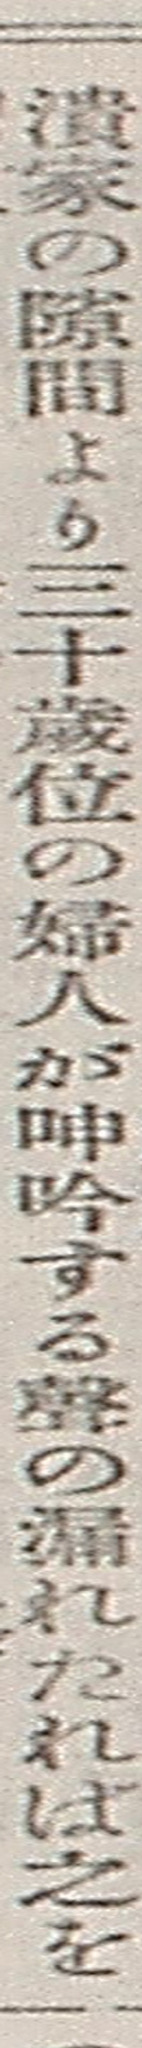潰家の隙間より三十歳位の婦人が呻吟する声の漏れたれば之を
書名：風俗畫報臨時増刊第百十九號　大海嘯被害録（中）
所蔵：東京大学地震研究所図書室 Earthquake Research Institute Library, The University of Tokyo, JAPAN
